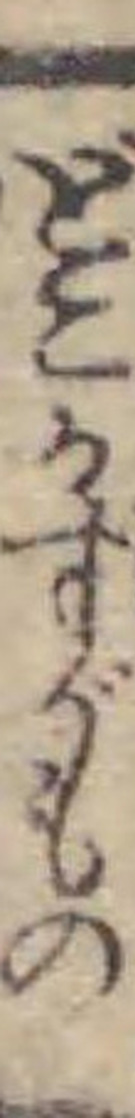どこかすがもの
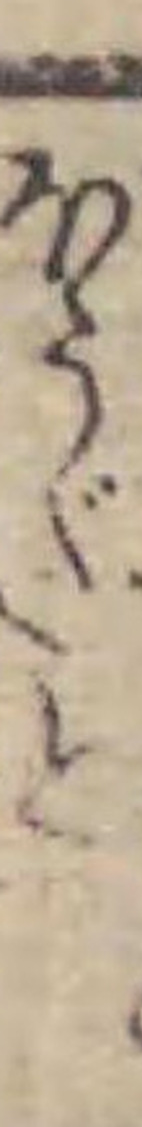ほうだと
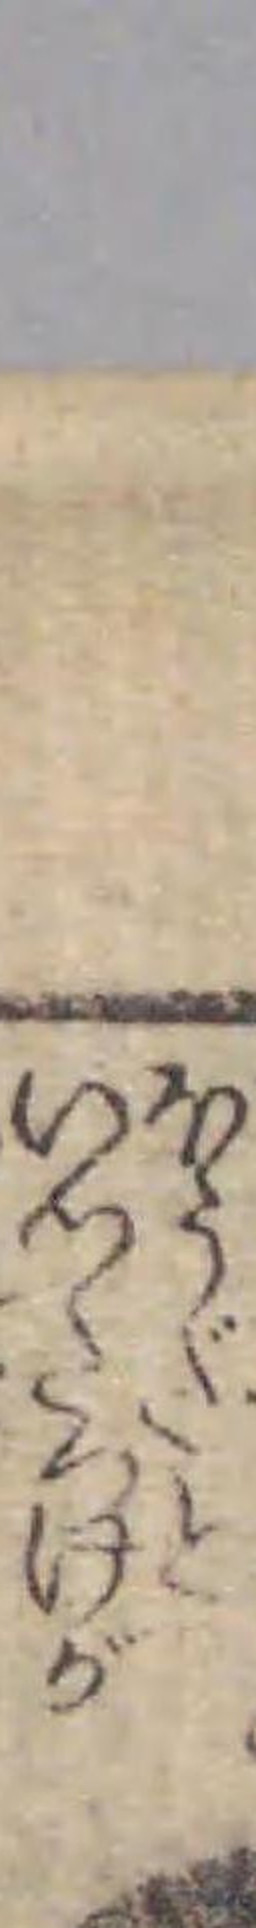いつたつけが
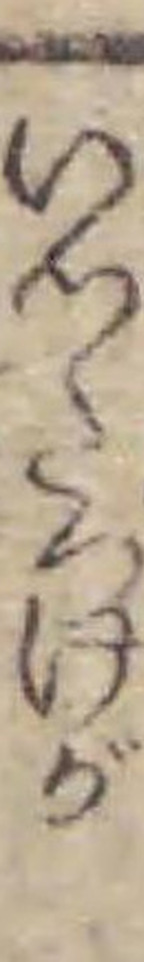いつたつけが
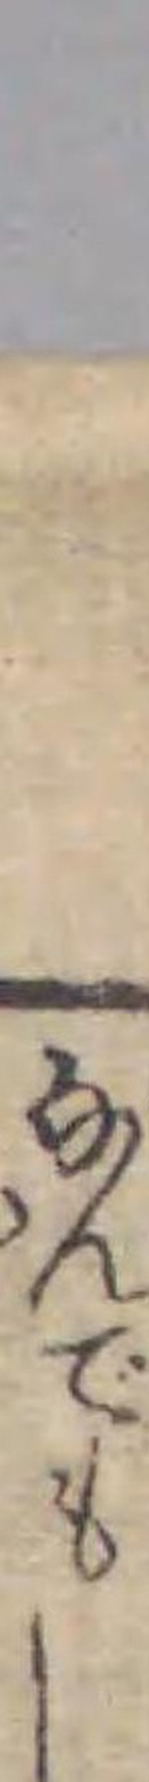なんでも
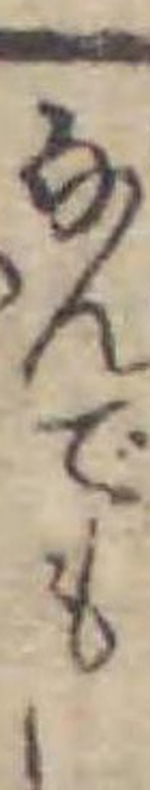なんでも
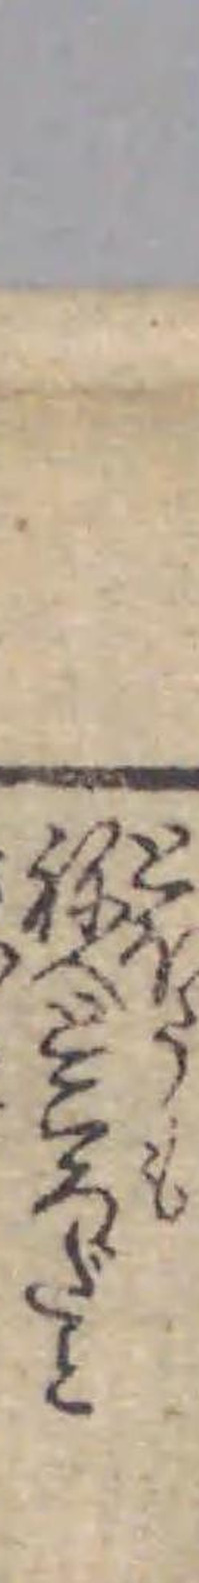ねへところだと
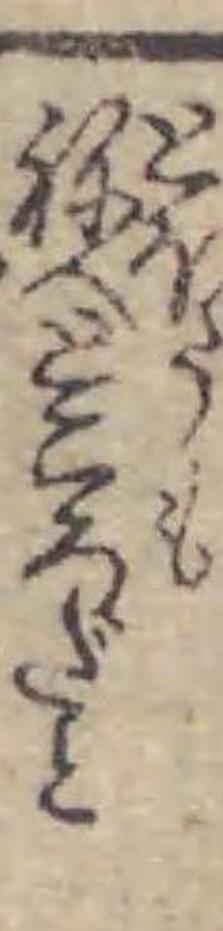ねへところだと
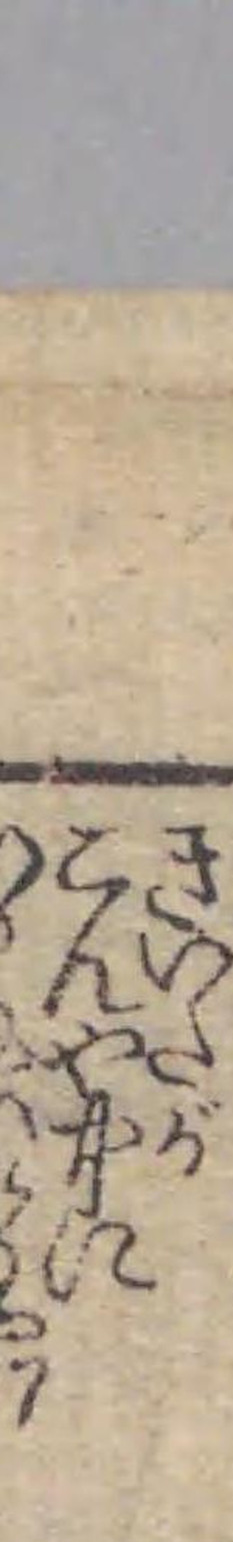こんや中に
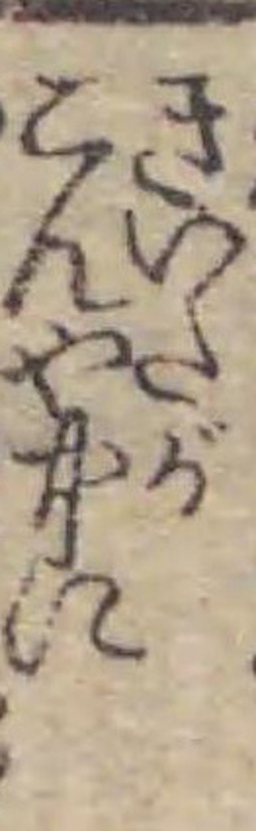こんや中に
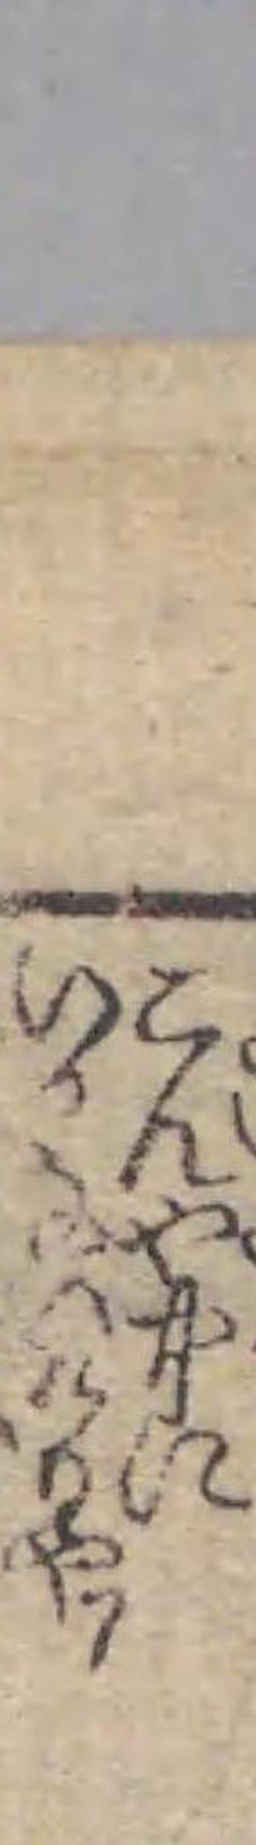いかないけりやァ
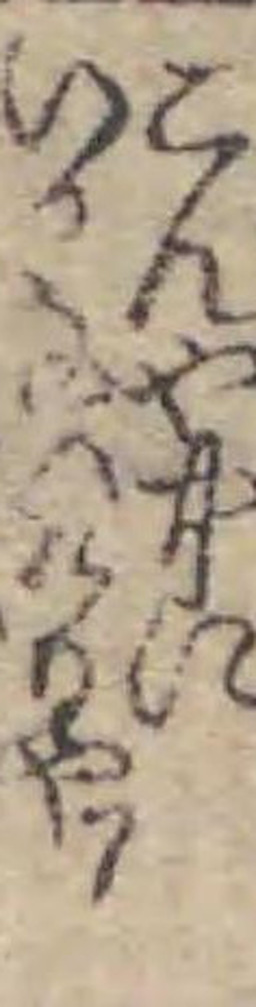いかないけりやァ
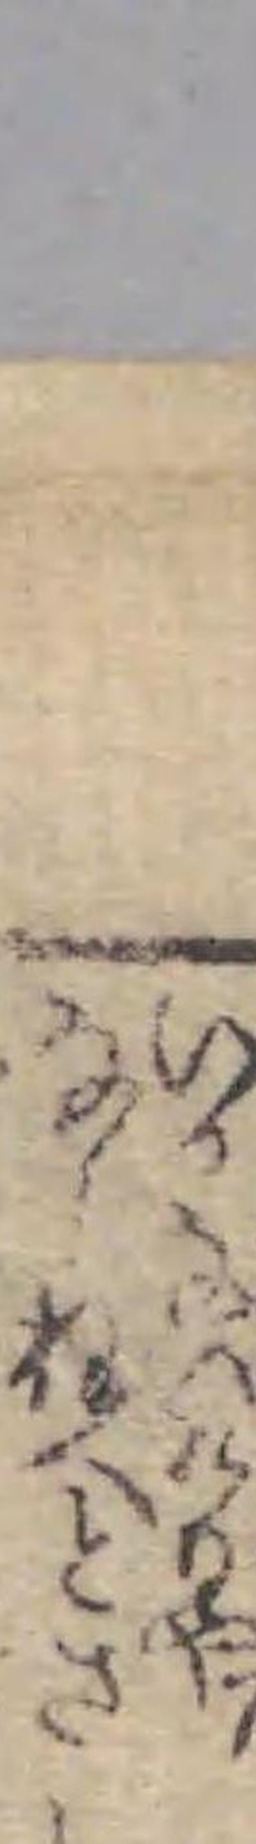ならねへとさ
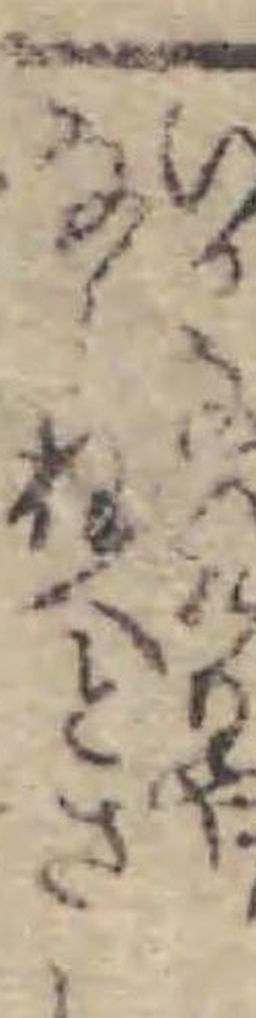ならねへとさ
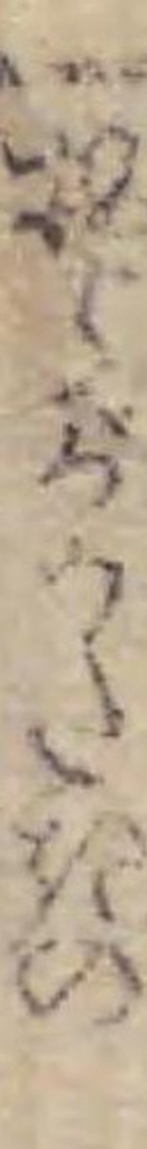おらがかたきの
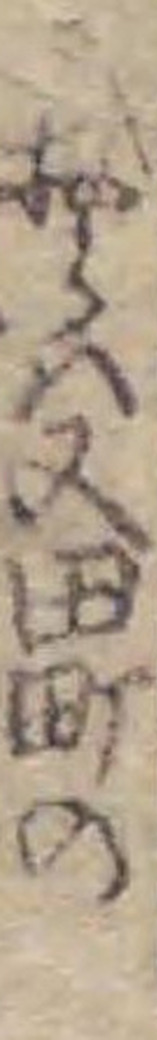〽おらは又田町の
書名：新鋳小判 : 3巻
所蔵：国立国会図書館 National Diet Library, JAPAN
